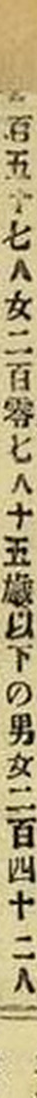百五十七人女二百零七人十五歳以下の男女二百四十二人
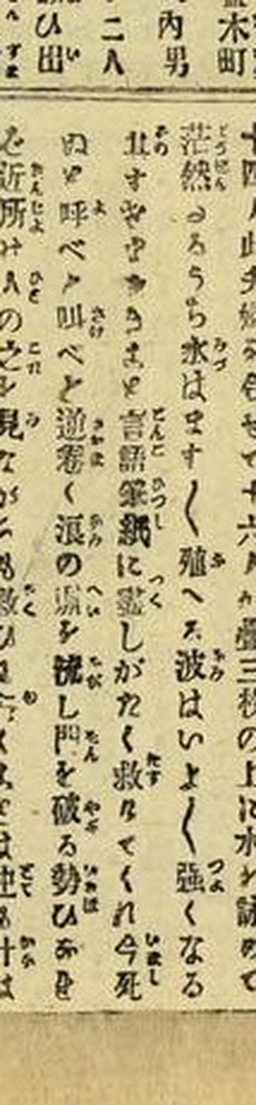其すさましきこと言語筆紙に盡しがたく救けてくれ今死
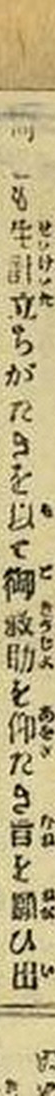何れも生計立ちがたきを以て御救助を仰たき旨を願ひ出
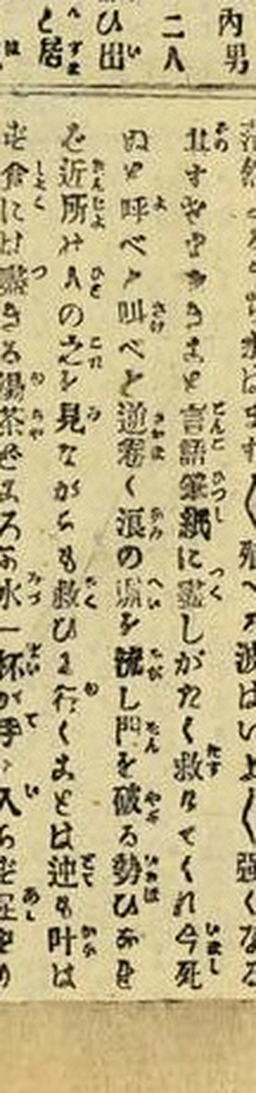ぬと呼べと叫べと逆巻く浪の塀を流し門を破る勢ひなれ
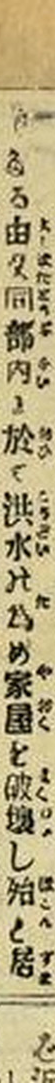でたる由又同部内に於て洪水の爲め家屋を破壊し殆と居
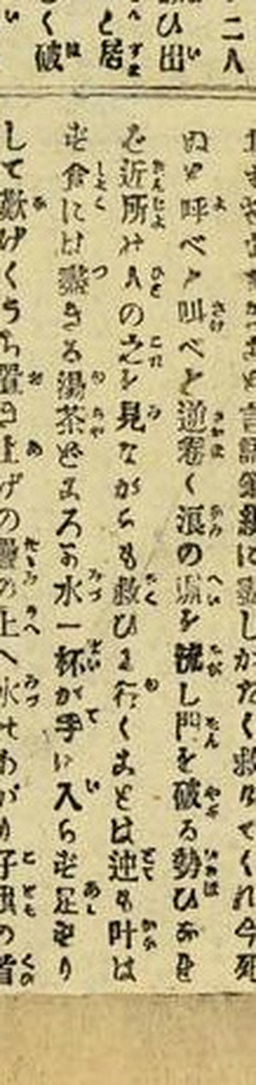ば近所の人の之を見ながらも救ひに行くことは迚も叶は
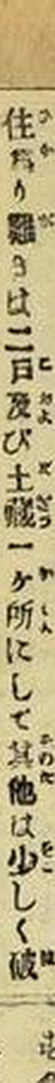住爲り難きは二戸及び土藏一ケ所にして其他は少しく破
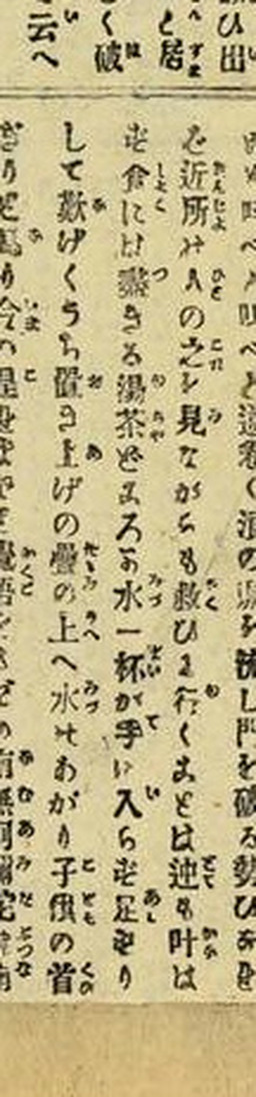ず食には盡きる湯茶どころか水一杯が手に入らず足すり
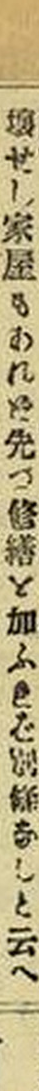壊せし家屋もあれど先づ修繕を加ふれば別條なしと云へ
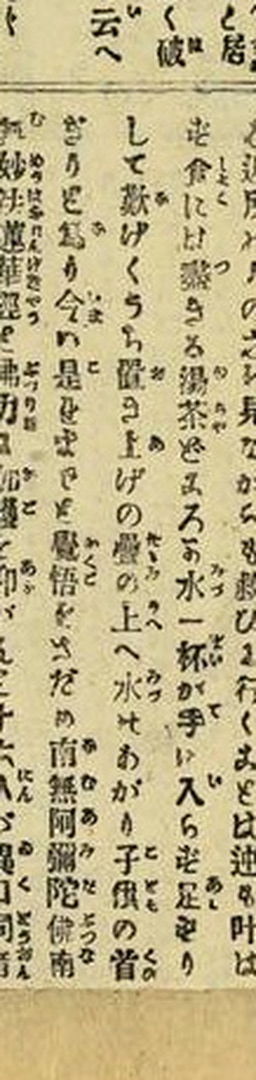して歎げくうち置き上げの疂の上へ水のあがり子供の首
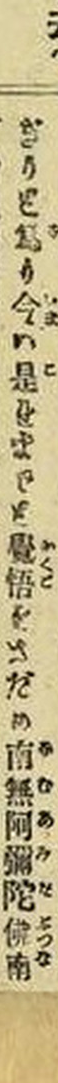ぎりと爲り今は是れまでと覺悟をさだめ南無阿彌陀佛南
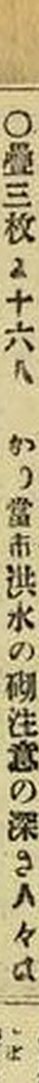○疂三枚に十六人かの當市洪水の砌注意の深さ人々は
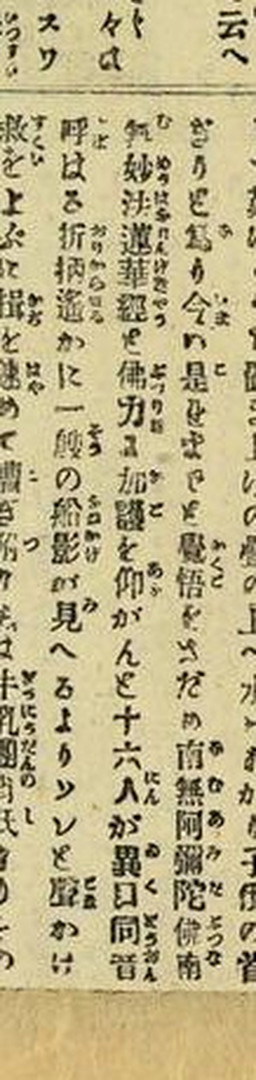無妙法蓮華經と佛力に加護を仰がんと十六人が異口同音
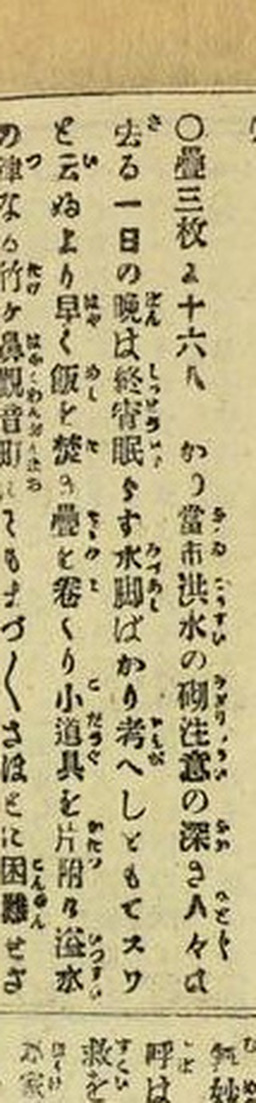去る一日の晩は終宵眠らす水脚ばかり考へしともてスワ
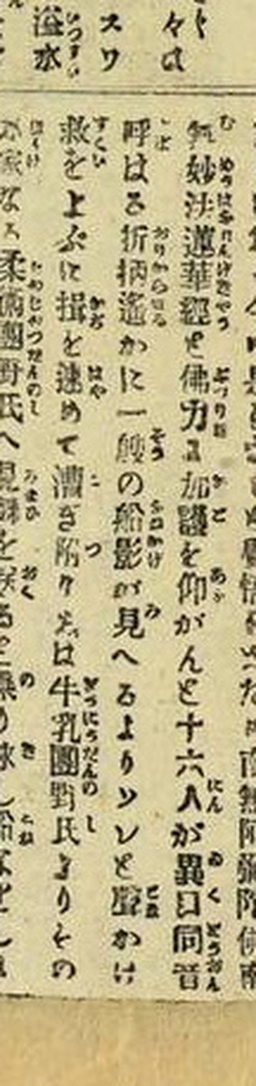呼はる折柄遙かに一艘の船影が見へるよりソレと聲かけ
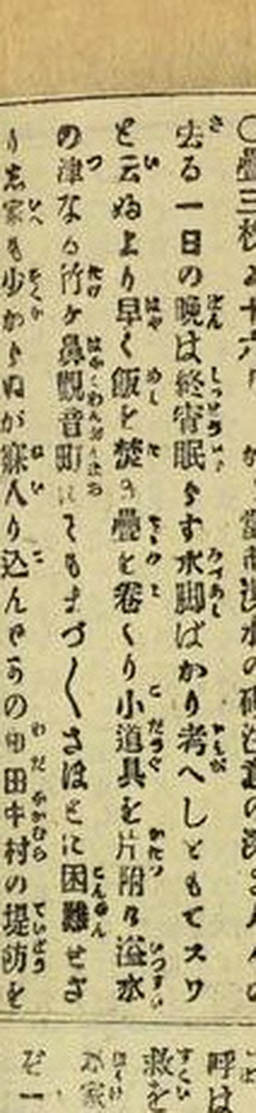と云ふより早く飯を焚き疂を巻くり小道具を片附け溢水
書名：温古集 五巻
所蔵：福井県文書館 Fukui Prefectural Archives
